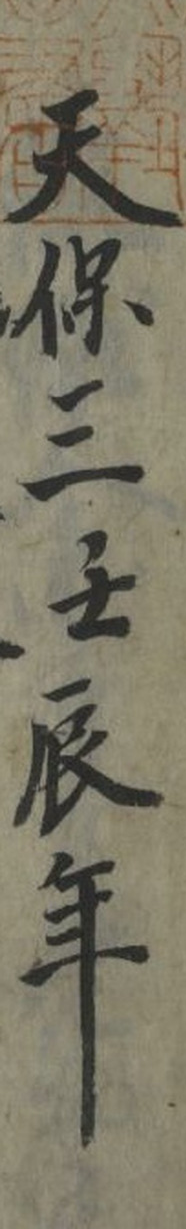天保三壬辰年
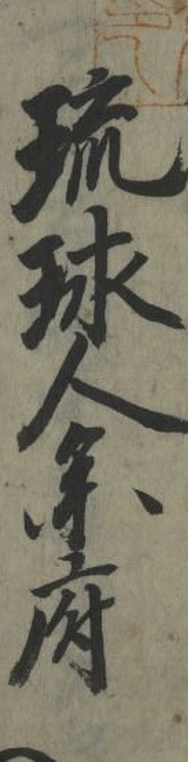琉球人参府

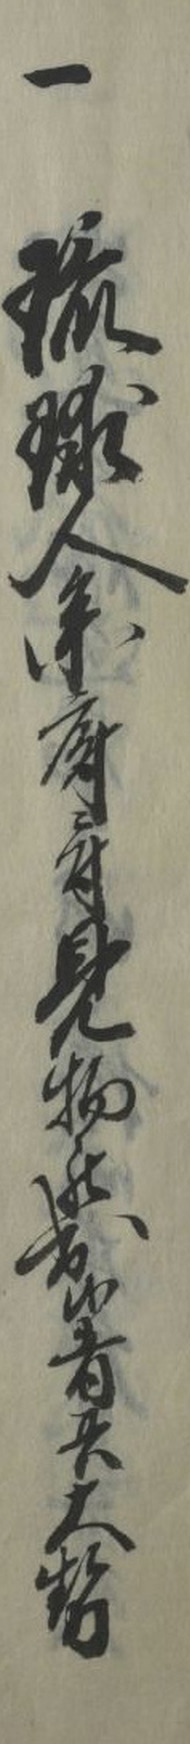一琉球人参府に付見物罷出候者共大勢
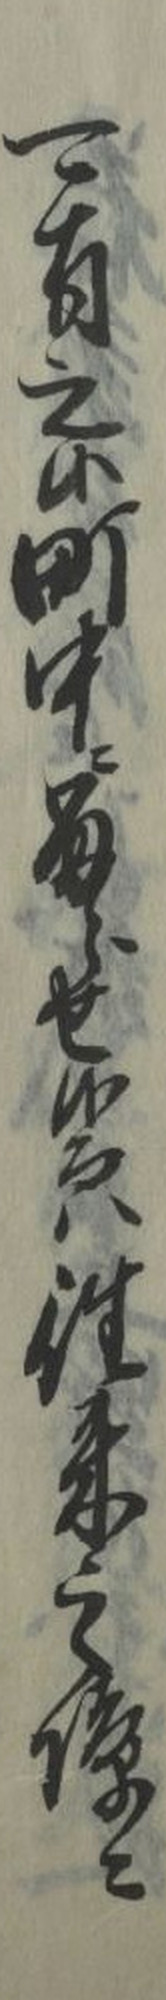可有之候町中に留らせ候而は往来之障に
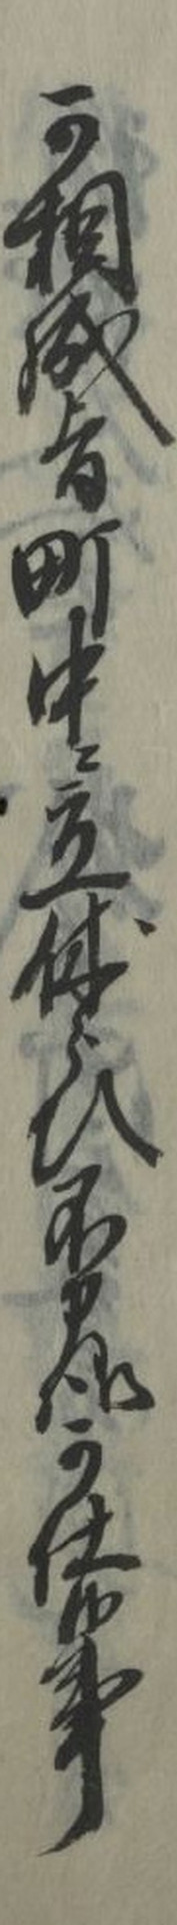可相成旨町中に立休らひ不申様可仕候事
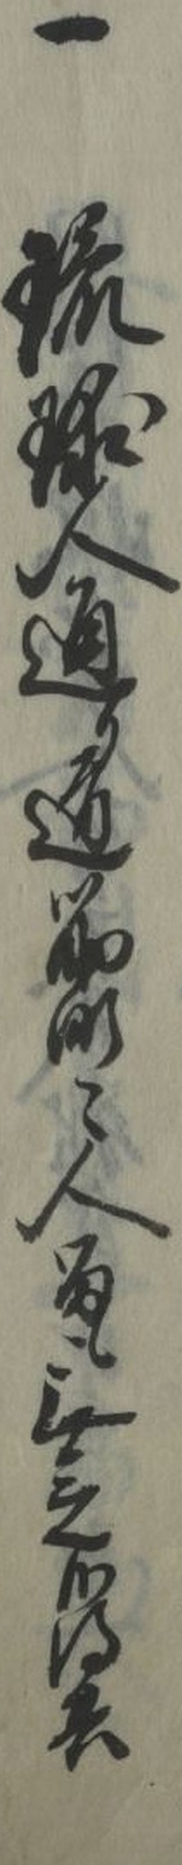一琉球人通り道筋町々人留も無之候得共
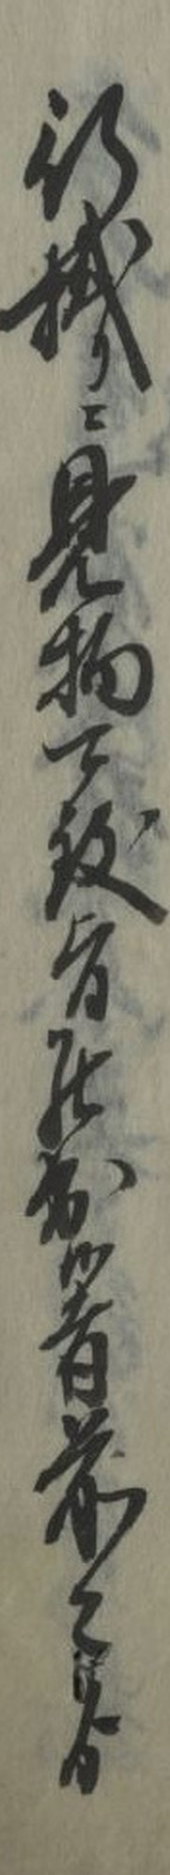行掛りに見物可致旨罷出候者前々ゟ

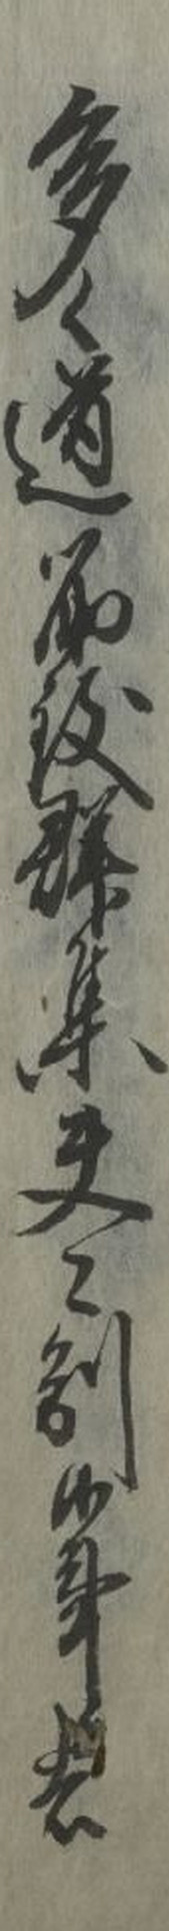多く道筋致群集夫々制候事着
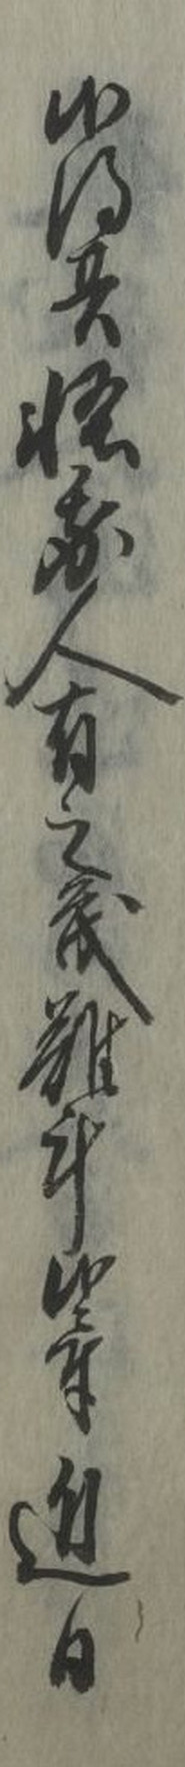候得共怪我人有之も難計候に付近日
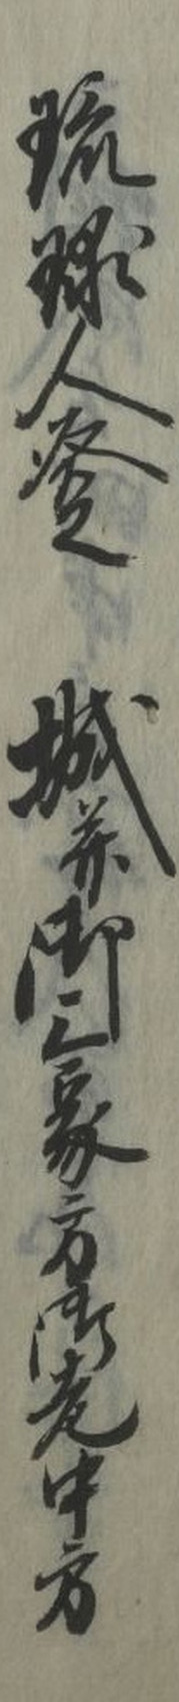琉球人登城幷御三家方御老中方
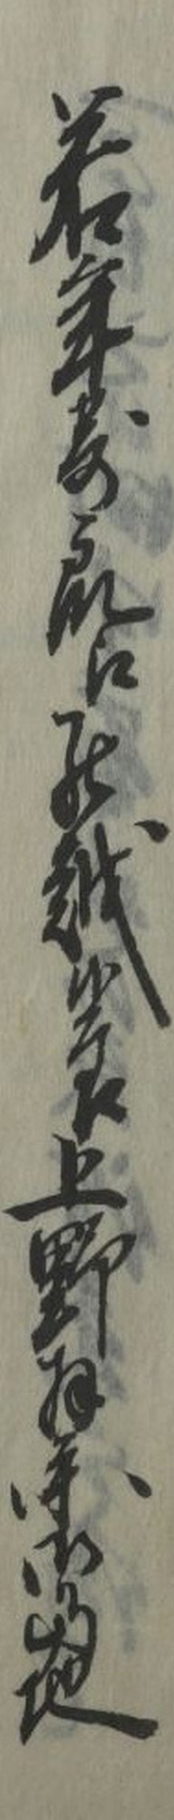若年寄衆え罷越候節上野拝参御当地
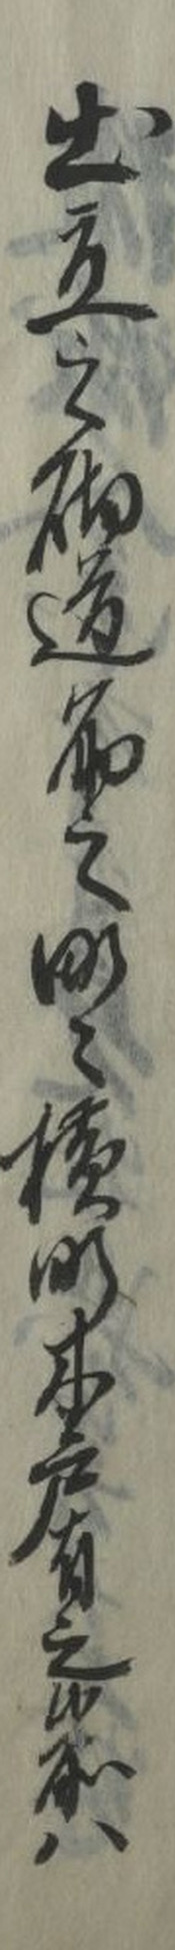出立之砌道筋之町々横町木戸有之候所は
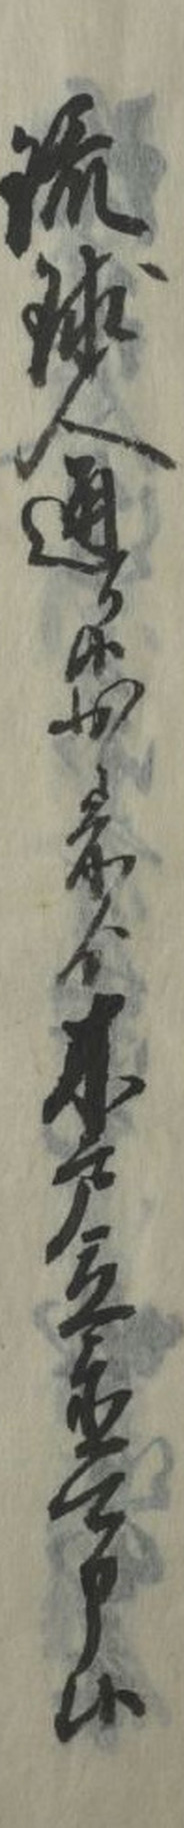琉球人通り候少々前ゟ木戸立置可申候
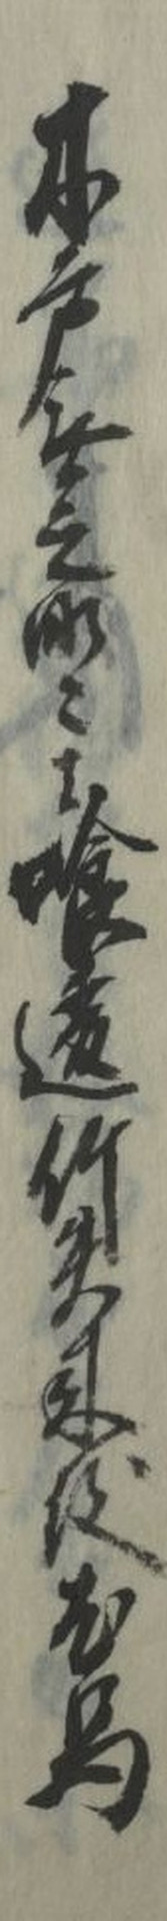木戸無之町々は喰違竹矢来致尤馬
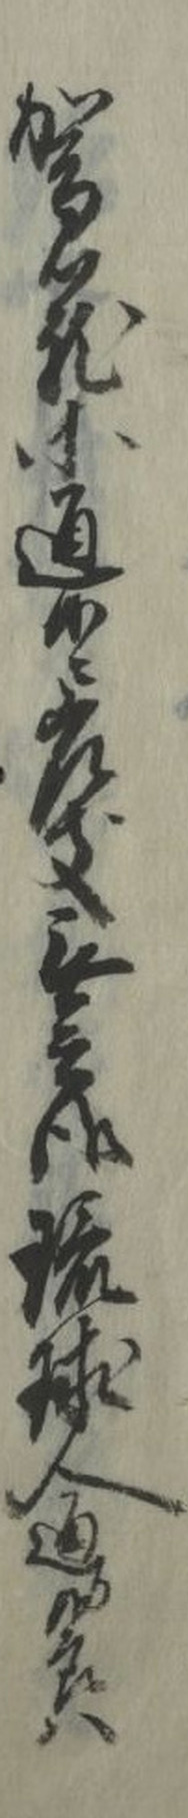駕籠等通候に差支無之様琉球人通り候節は
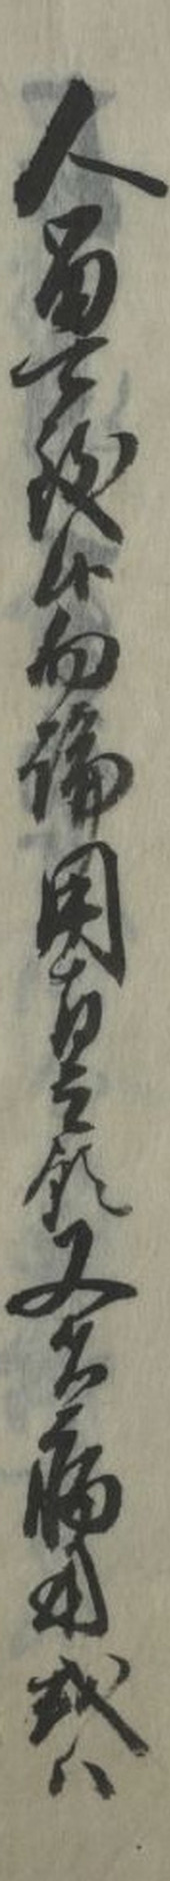人留可致候勿論用有之願又は病用或は
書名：天保三壬辰年・琉球人参府・弐朱吹立御触写
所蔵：University of the Ryukyus Library
